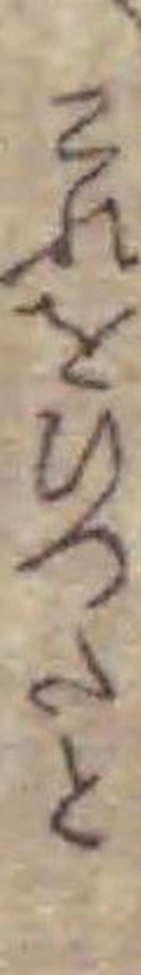これをひつたと
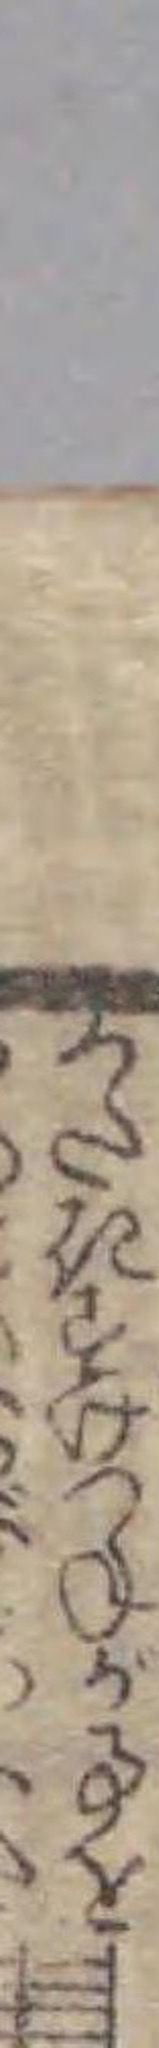かたきすけつねが事を
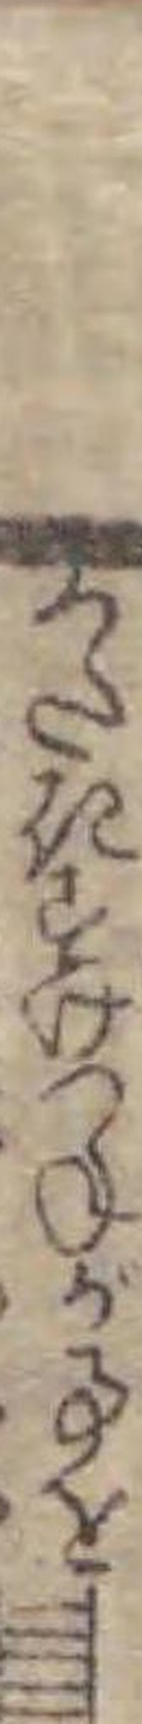かたきすけつねが事を
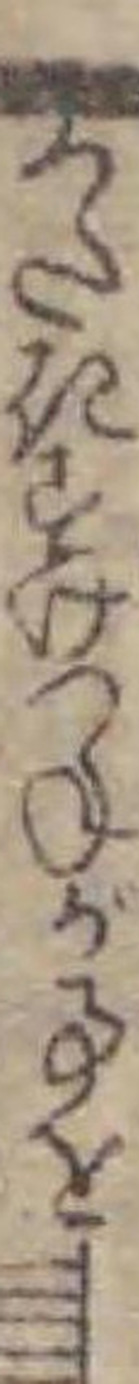かたきすけつねが事を
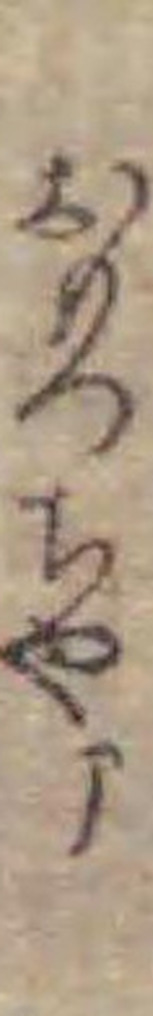おもつち
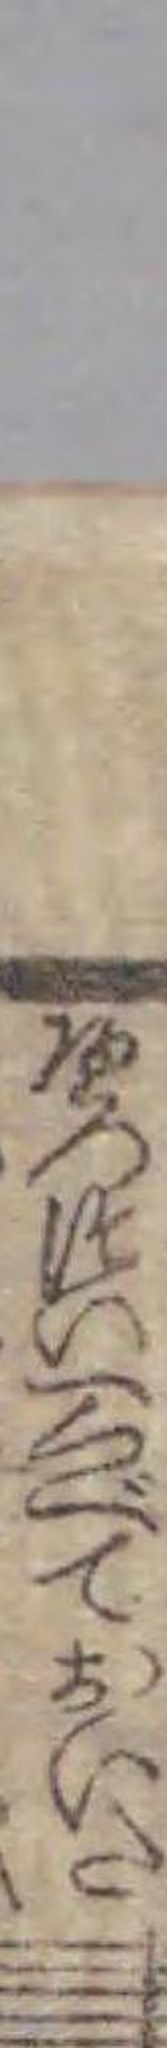へつついへくべておいた
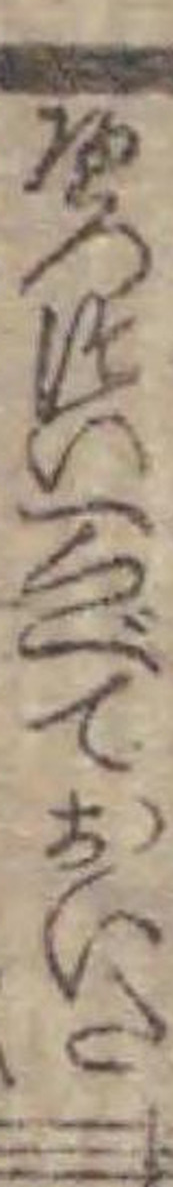へつついへくべておいた
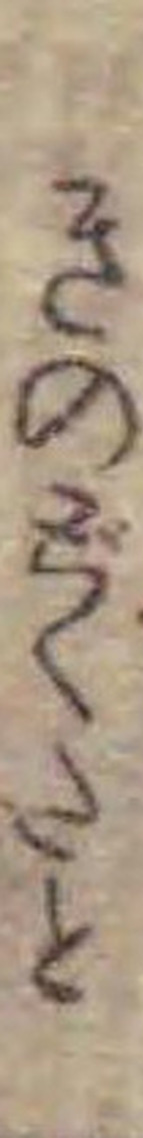きのどくたと
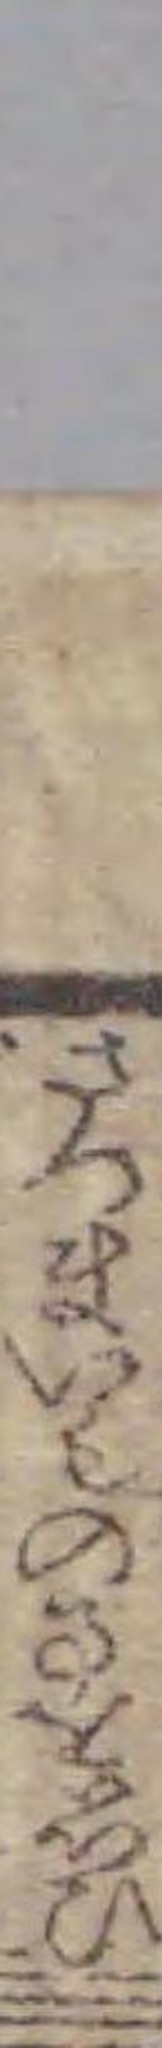さつまいもの事を思ひ
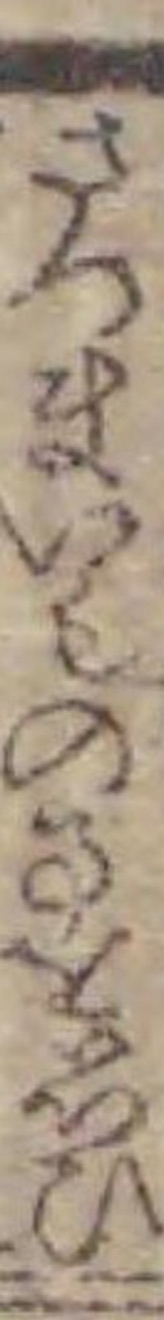さつまいもの事を思ひ
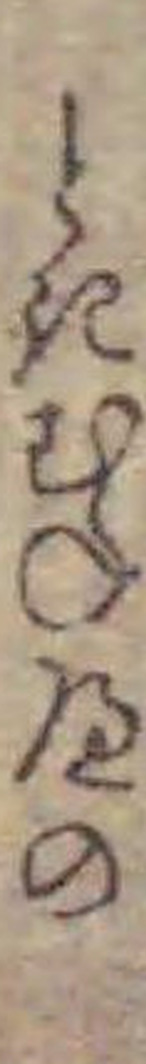ときむねへの
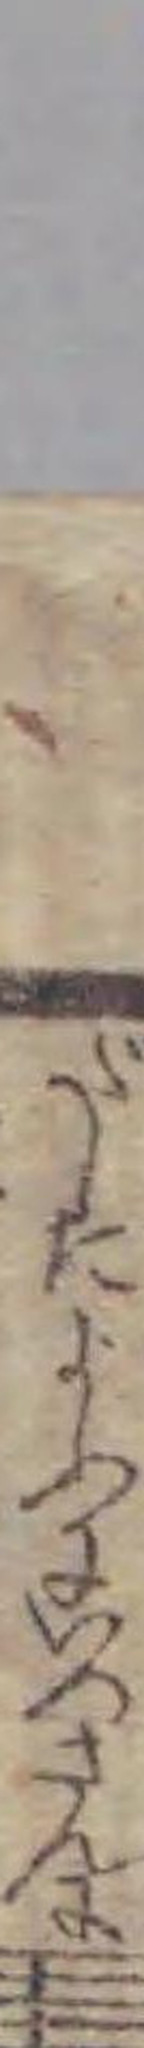だしたよふにいつさんに
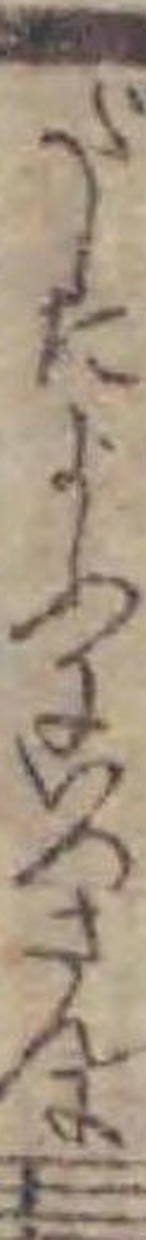だしたよふにいつさんに
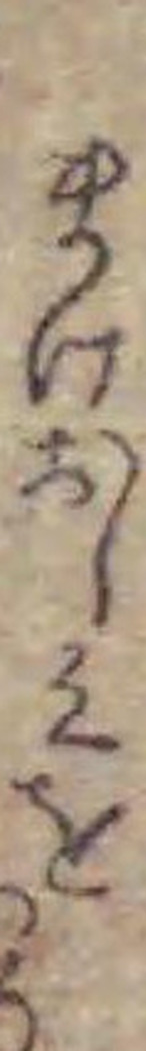まけおしみを
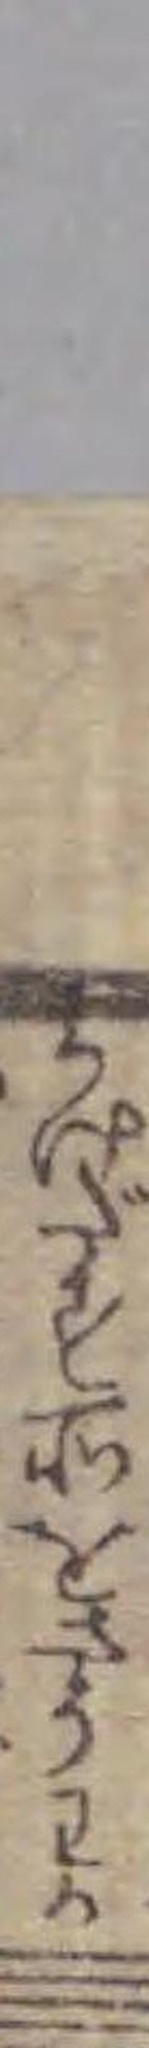かけだす所をさうわか
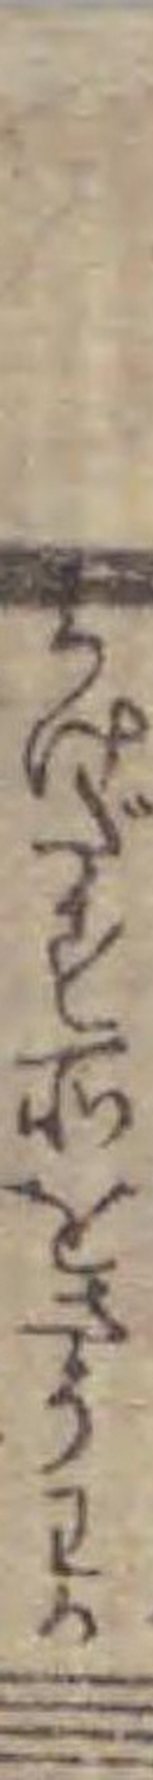かけだす所をさうわか
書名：年寄之冷水曽我 : 3巻
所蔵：国立国会図書館 National Diet Library, JAPAN
